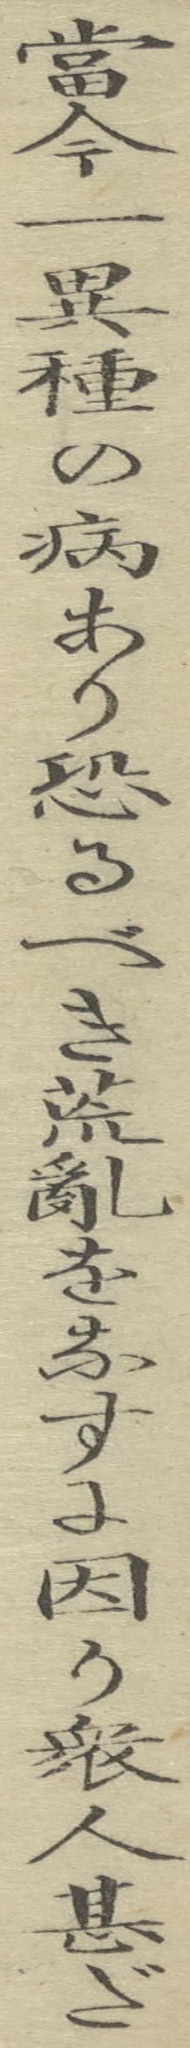當今一異種の病あり恐るべき荒亂をなすに因り衆人甚だ
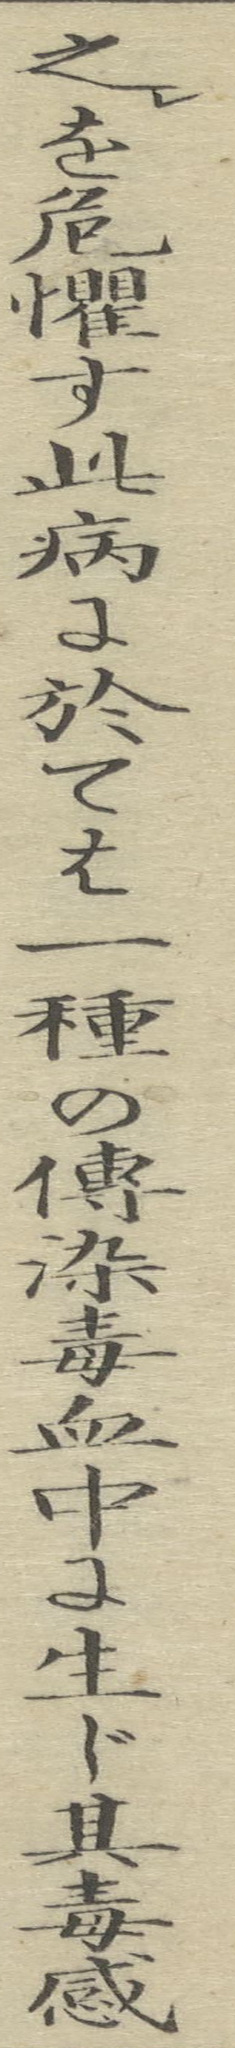之危懼す此病に於ては一種の傅染毒血中に生じ其毒感
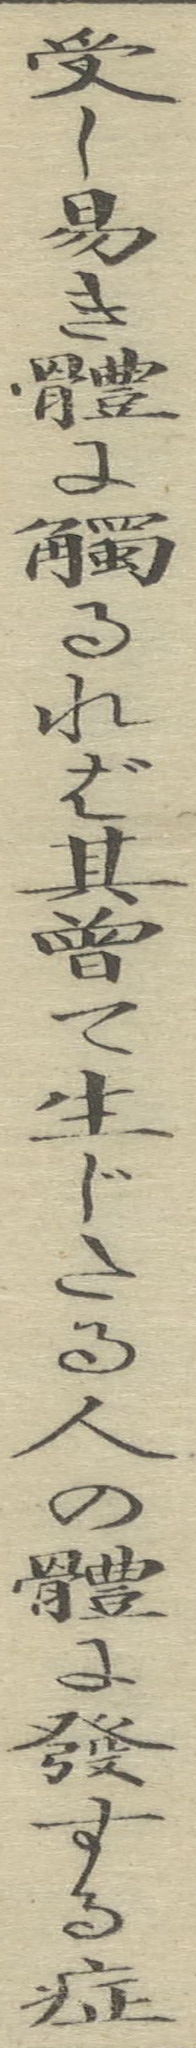受し易き體に觸るれば其曽て生じたる人の體に發する症
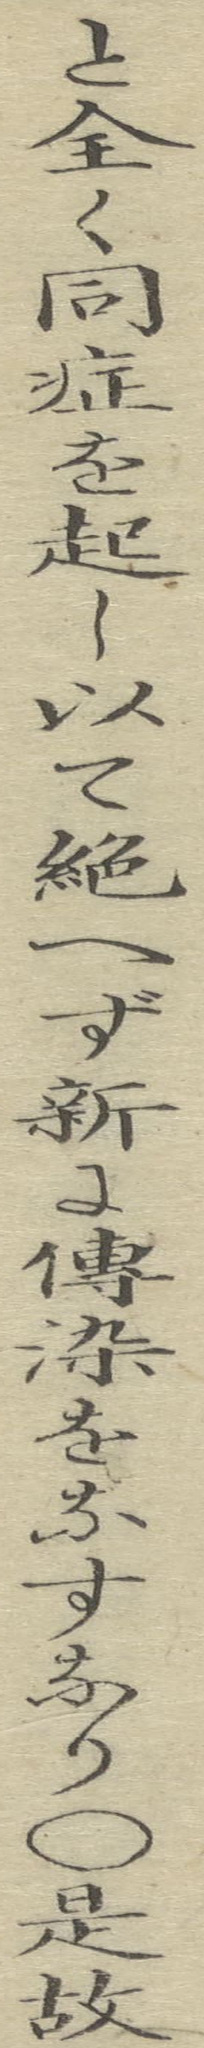と全く同症を起し以て絶へず新に傅染をなすなり〇是故
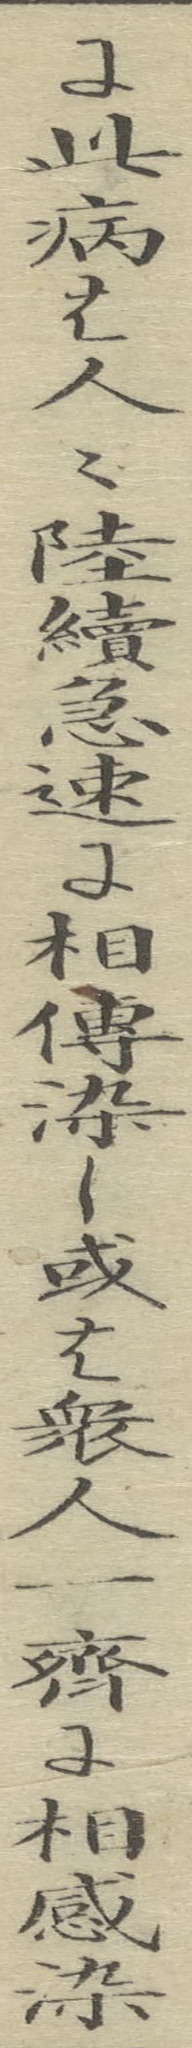に此病は人々陸續急速に相傅染し或は衆人一齋に相感染
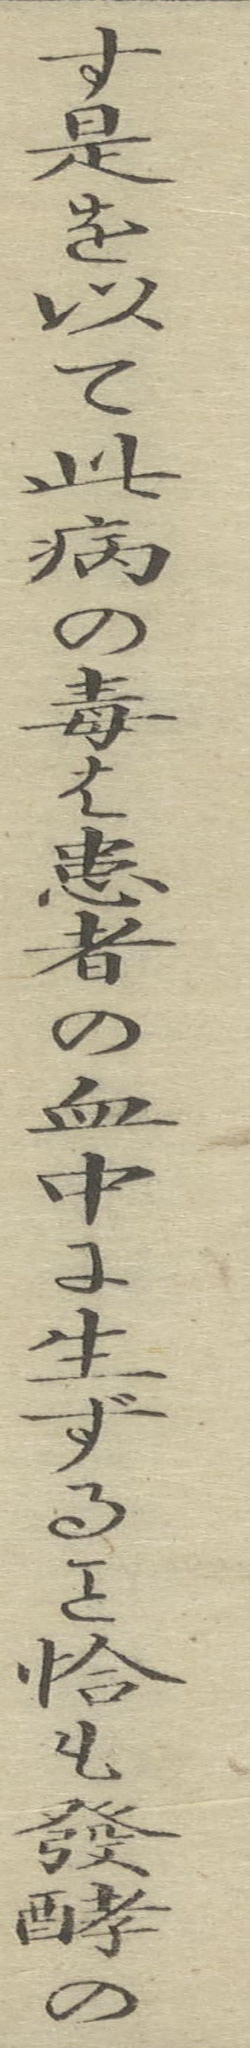す是を以て此病の毒は患者の血中に生ずること恰も發酵の
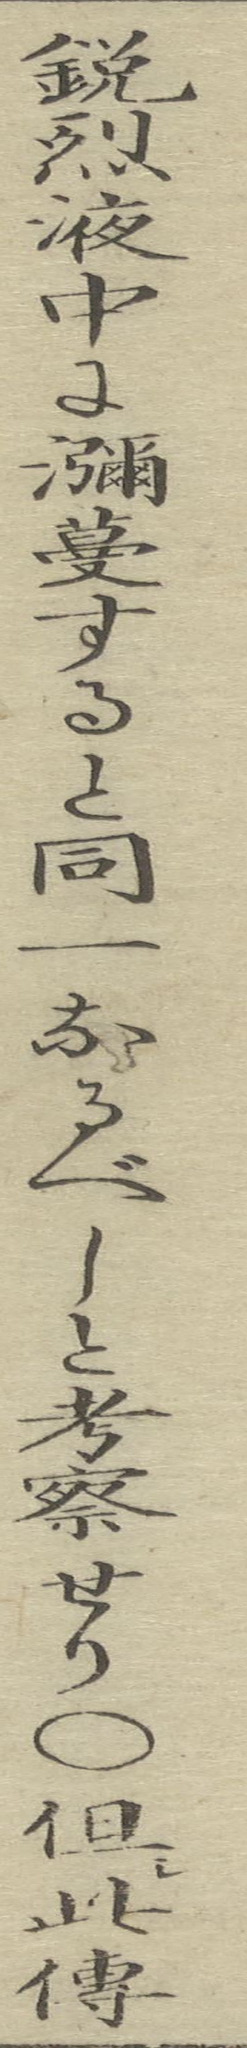鋭烈液中に瀰蔓すると同一なるべしと考察せり〇但此傅
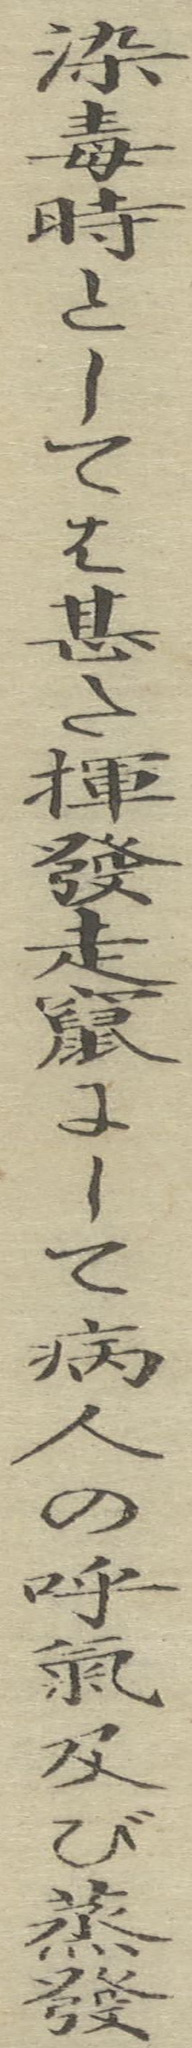染毒時としては甚た揮發走竄にして病人の呼氣及び蒸發
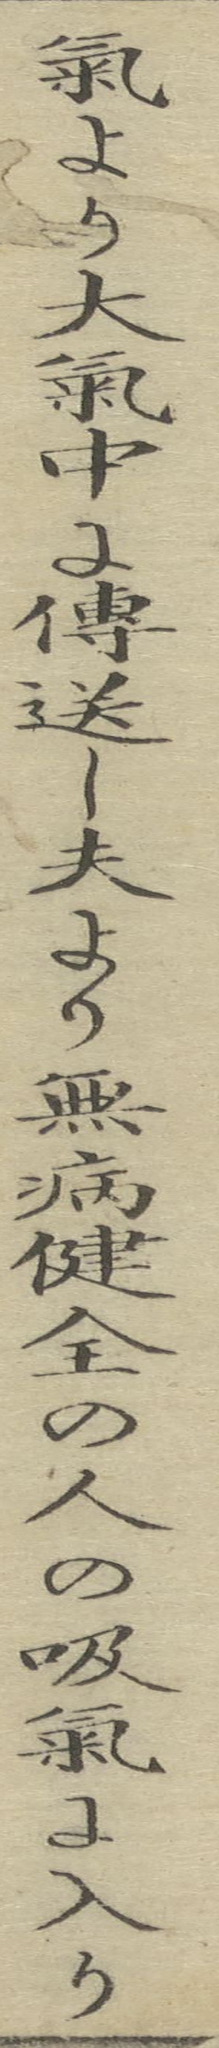氣より大氣中に傅送し夫より無病健全の人の吸氣に入り

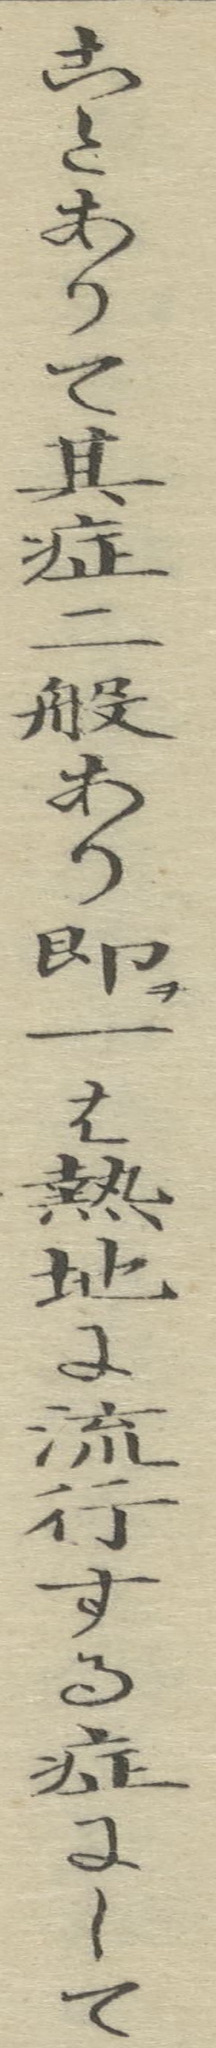ことありて其症二般あり即一は熱地に流行する症にして
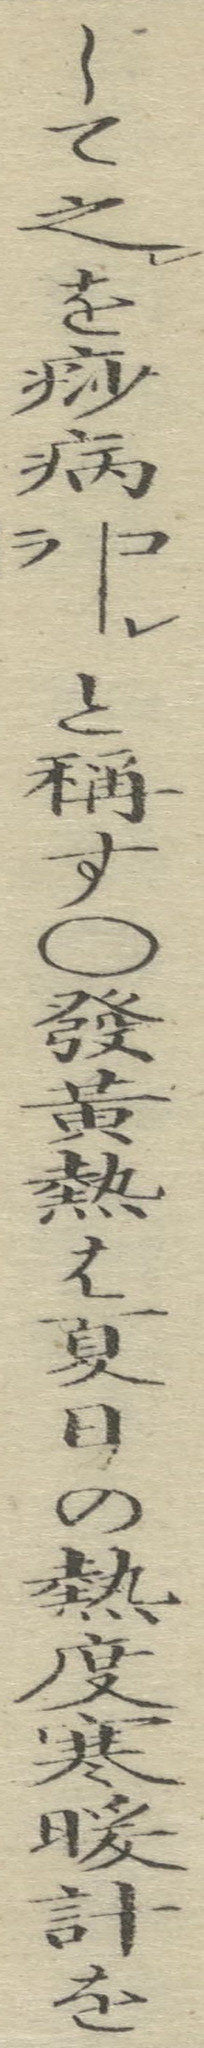して之痧病コレラと稱す〇發黄熱は夏日の熱度寒暖計を
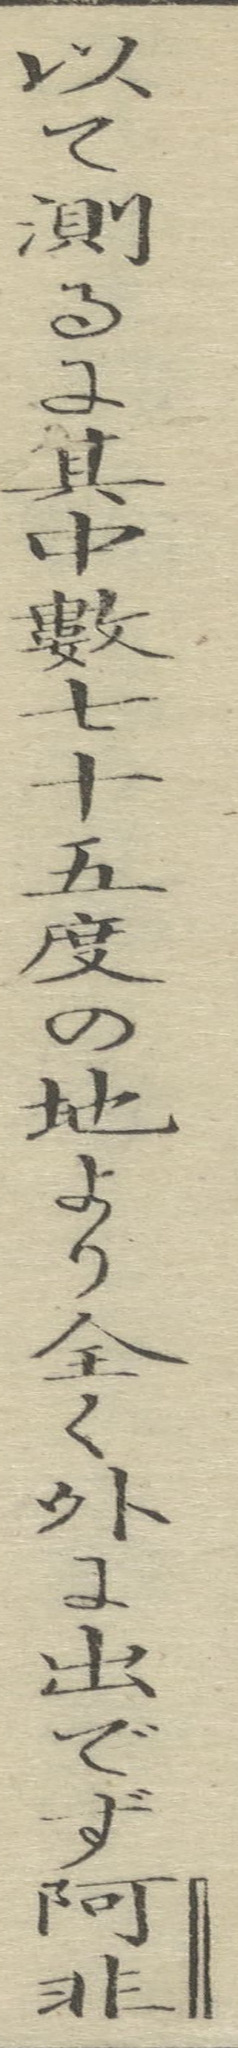以て測るに其中數七十五度の地より全く外に出でず阿非
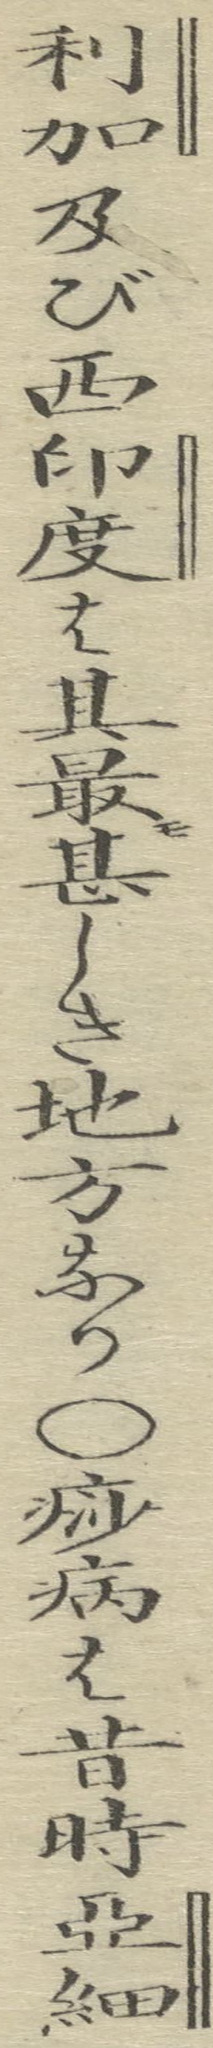利加及び西印度は其最甚しき地方なり〇痧病は昔時亞細
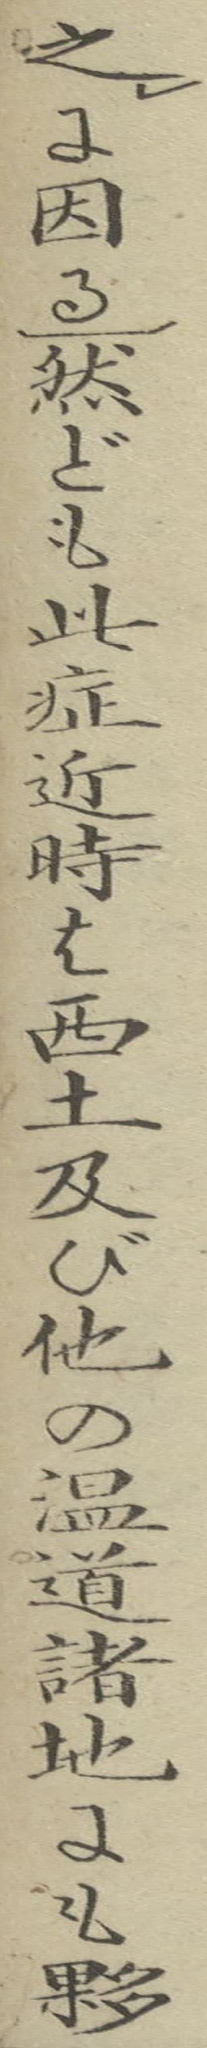之因る]然ども此症近時は西土及び他の温道諸地にも夥
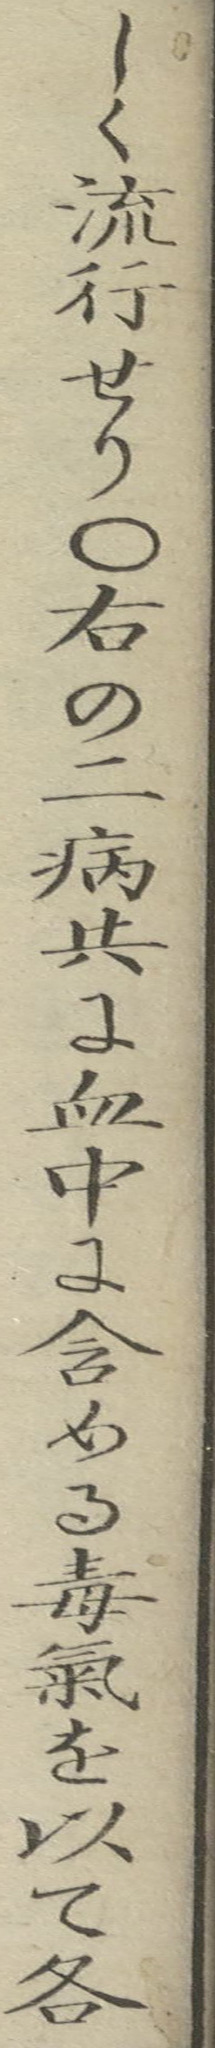しく流行せり〇右の二病共に血中に含める毒氣を以て各
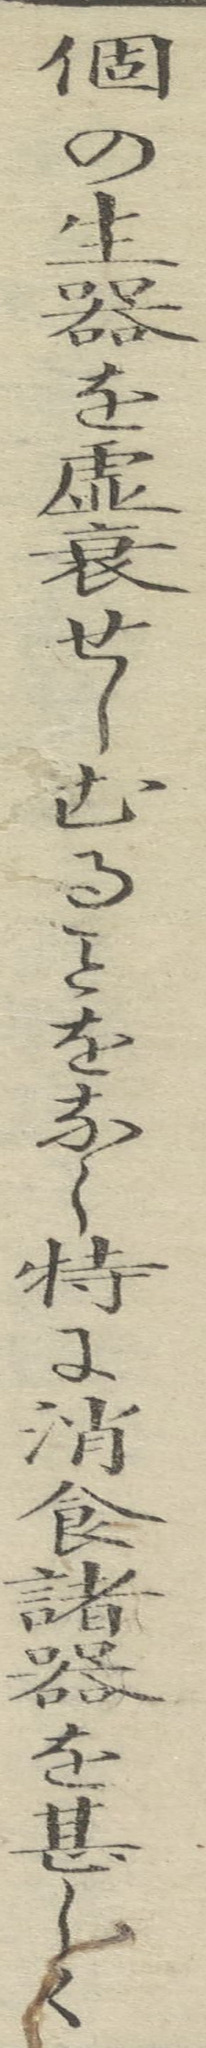個の生器を虚衰せしむることをなし特に消毒諸器を甚しく
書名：官版疫毒預防説　全
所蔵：東京大学総合図書館 General Library in the University of Tokyo, JAPAN
